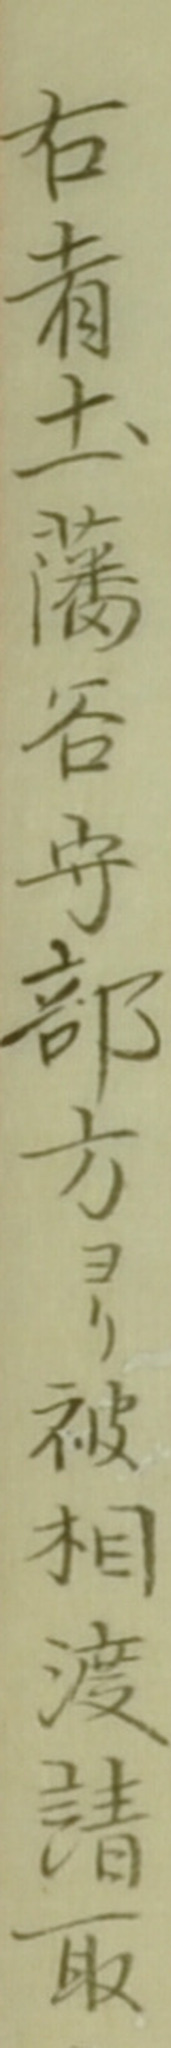右者土藩谷守部方ヨリ被相渡請取之
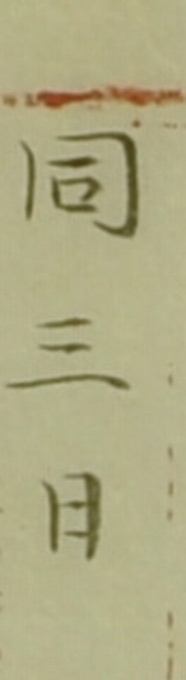同三日
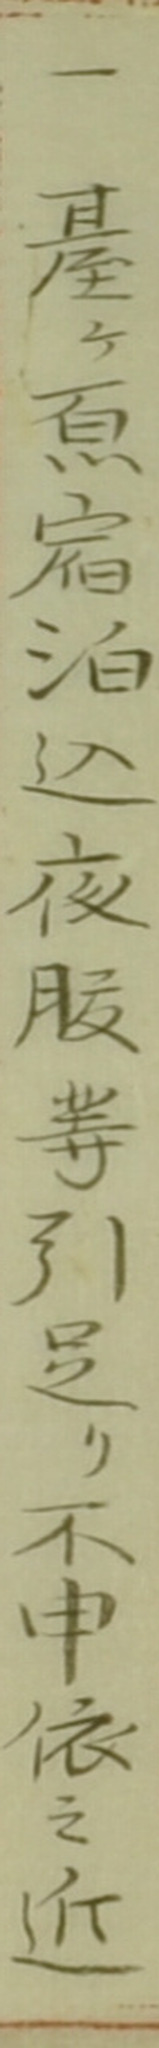一臺ケ原宿泊込夜服等引足リ不申依之近
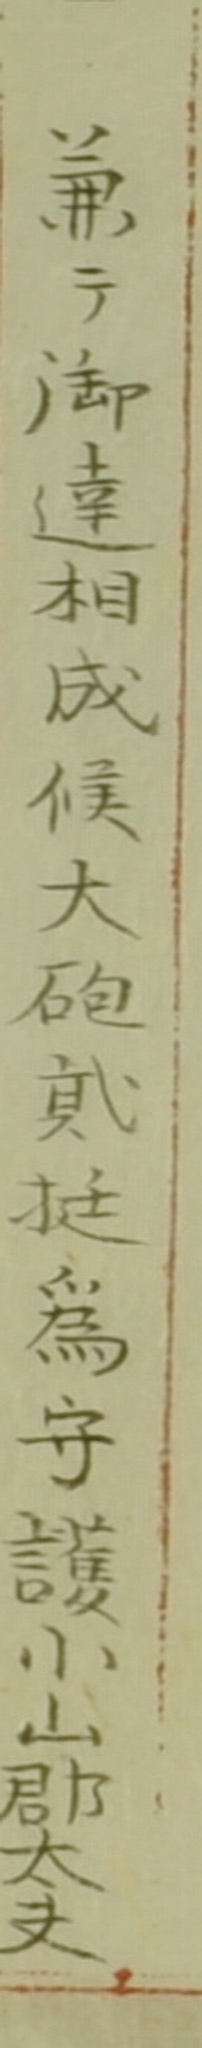一兼テ御達相成候大砲貮挺為守護小山郡太夫
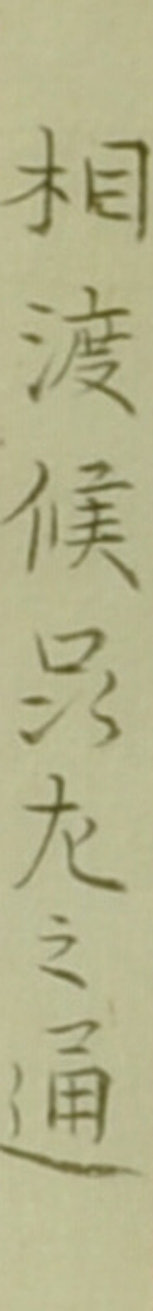相渡候品左之通
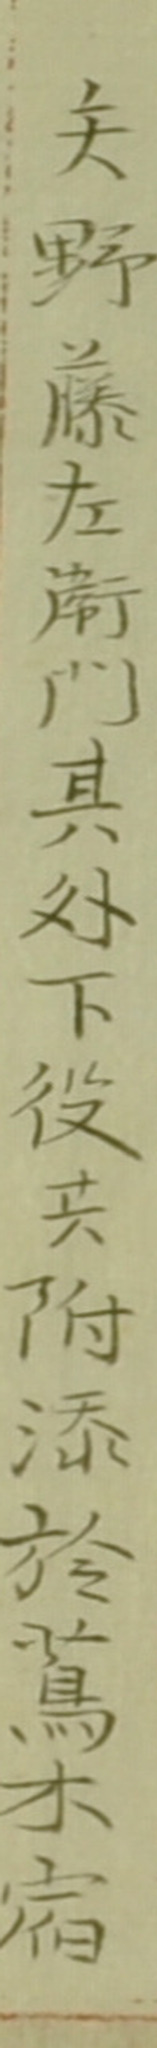矢野藤左衛門其外下役共附添於蔦木宿

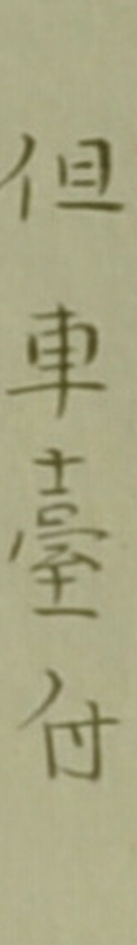但車臺付
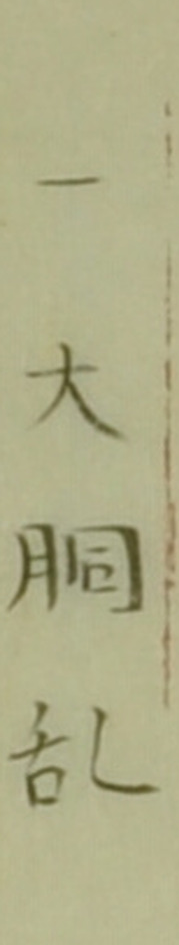一大胴乱貮
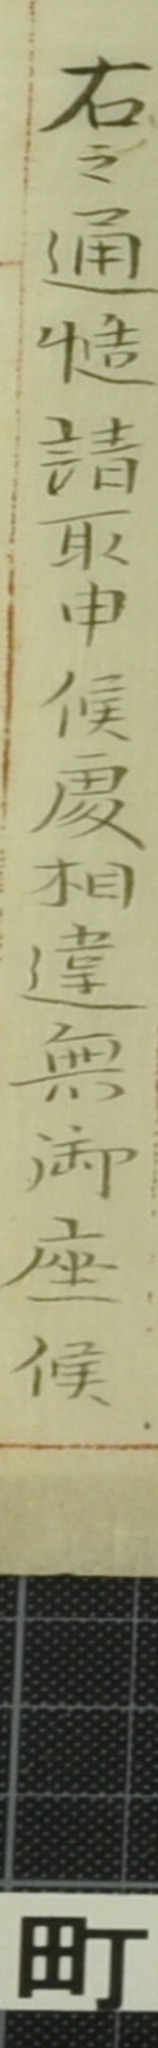右之通慥請取申候處相違無御座候

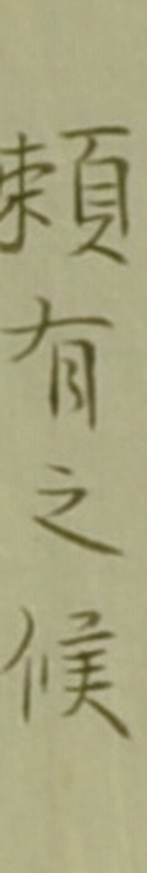頼有之候
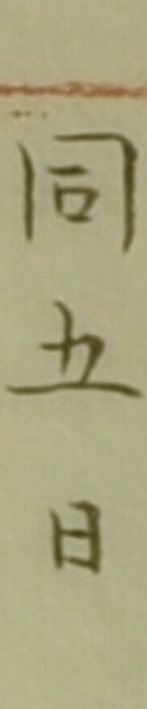同五日
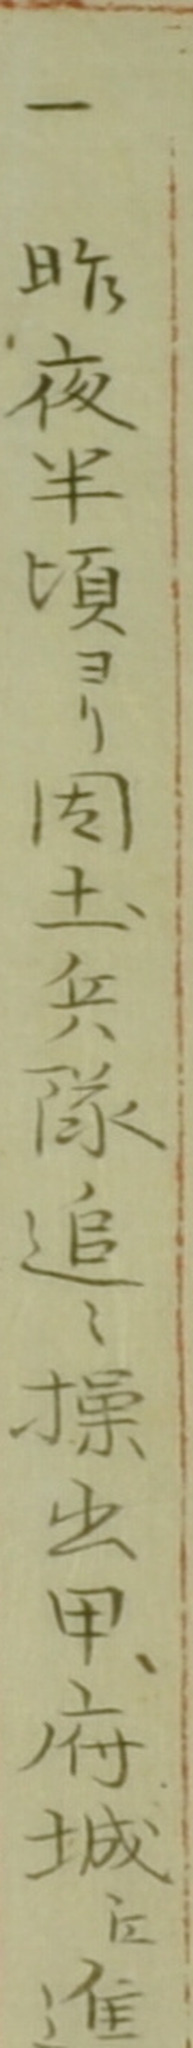一昨夜半頃ヨリ因土兵隊追々操出甲府城江進ミ
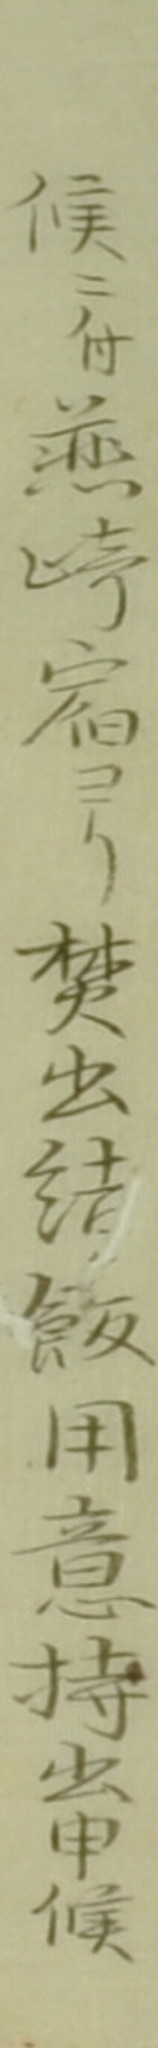候ニ付韮崎宿ヨリ焚出結飯用意持出申候
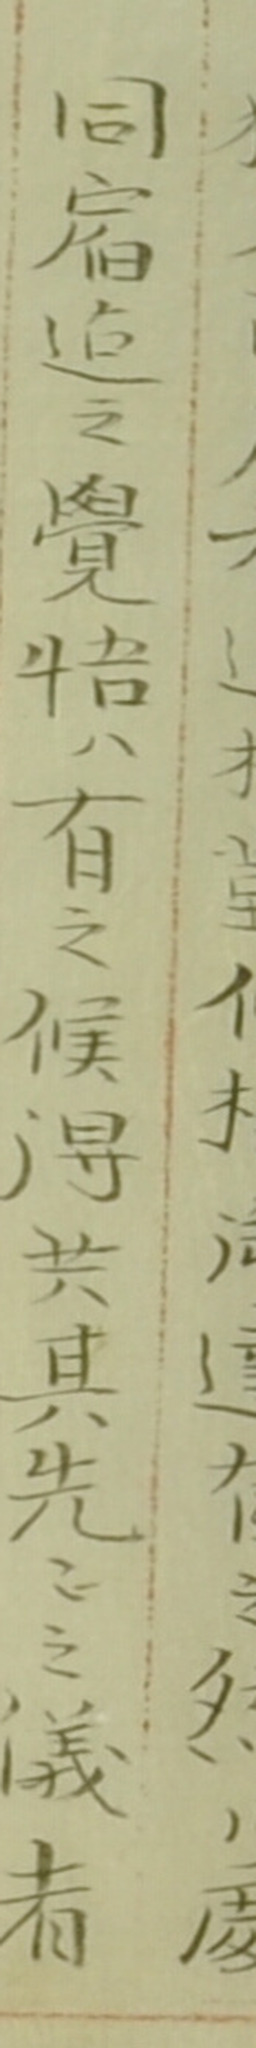同宿迄之覚悟ハ有之候得共其先々之儀者
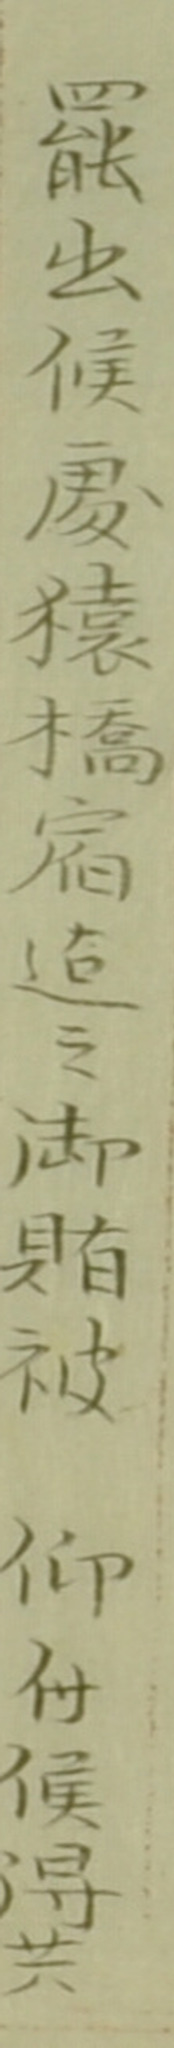罷出候處猿橋宿迄之御賄被仰付候得共
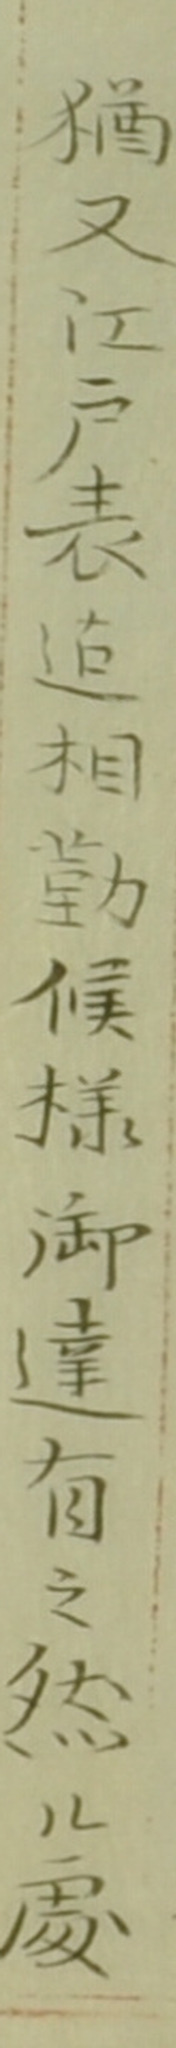猶又江戸表迄相勤候様御達可有之然ル處
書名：御東征ニ付甲州口兵食人馬御賄之事件（控）
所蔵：伊那市立高遠町図書館・合同会社AMANE
